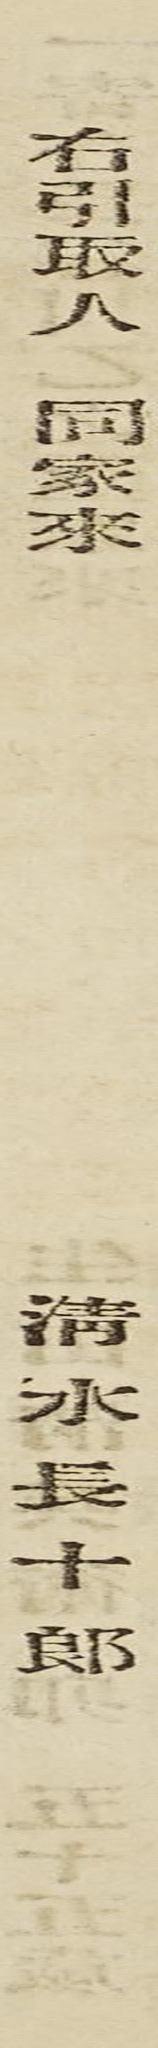右引取人同家来清水長十郎
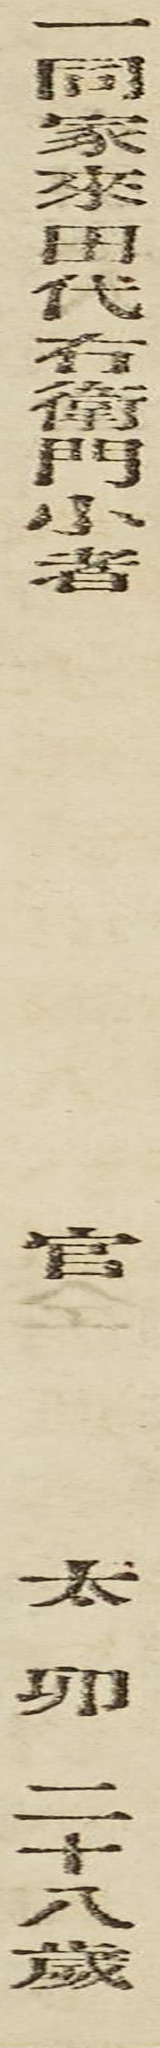一同家来田代右衛門小者官太卯二十八歳
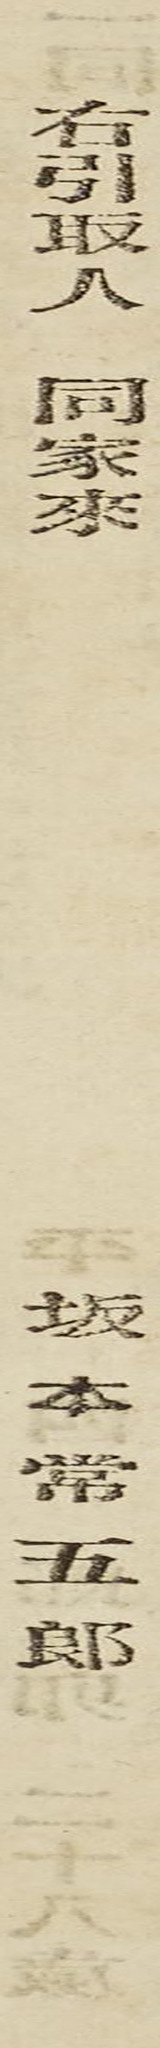右引取人同家来坂本常五郎
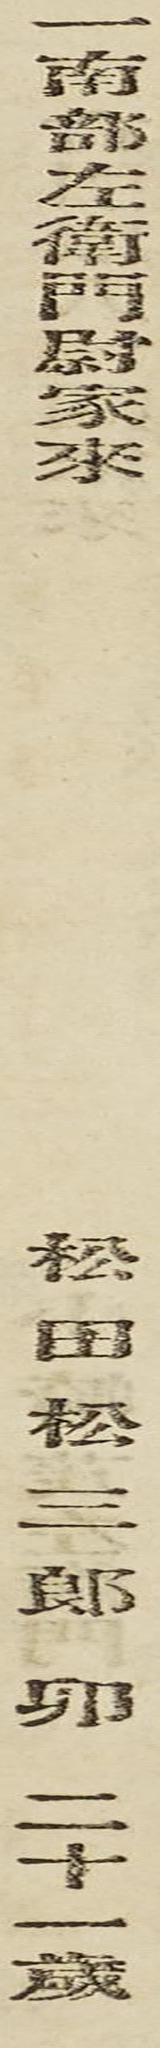一南部左衛門尉家来松田松三郎卯二十一歳
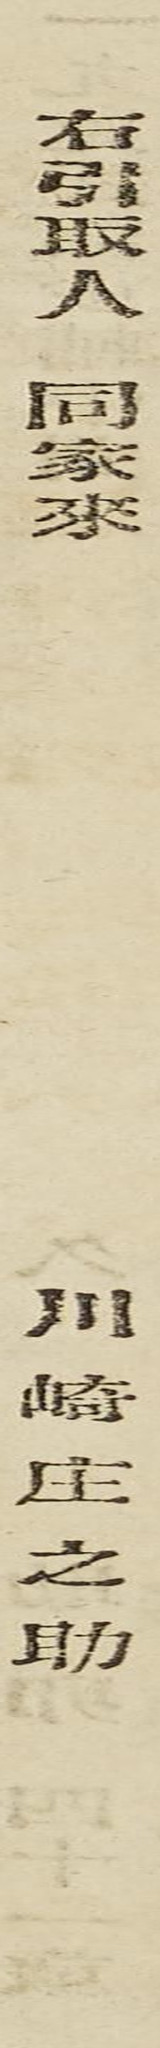右引取人同家来川崎庄之助
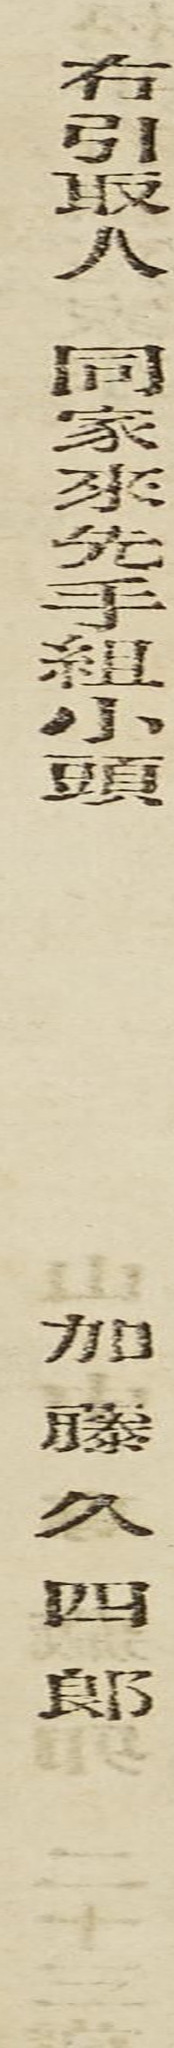右引取人同家来先手組小頭加藤久四郎
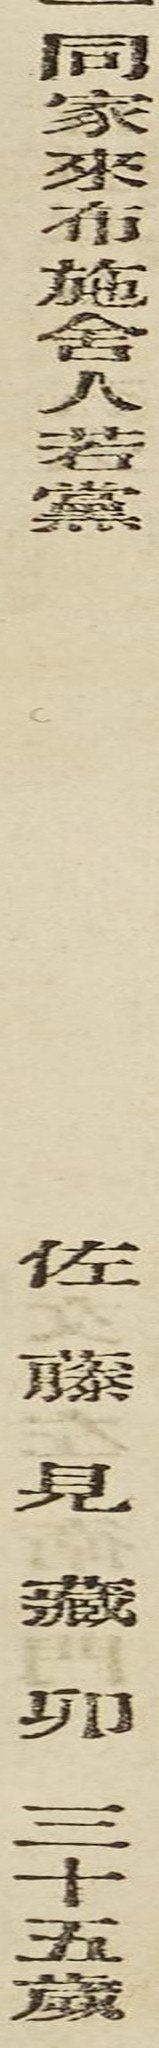一同家来布施舎人若党佐藤見蔵卯三十五歳
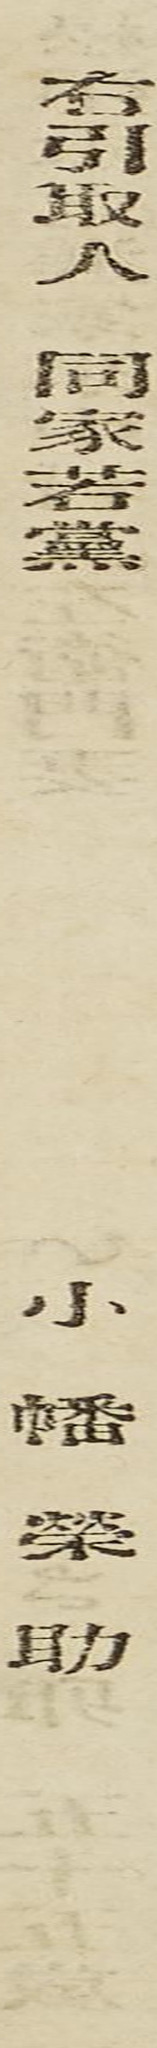右引取人同家若党小幡栄助
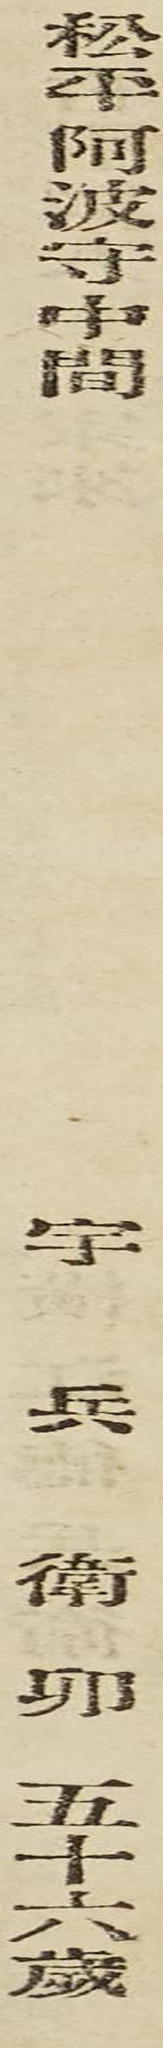一松平阿波守中間宇兵衛卯五十六歳
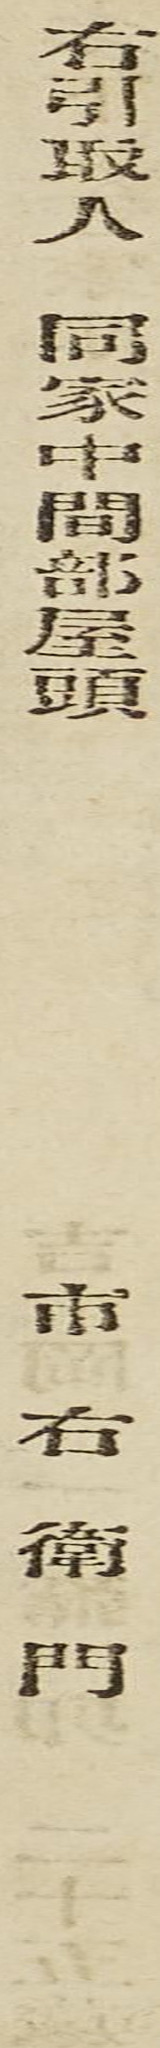右引取人同家中間部屋頭市右衛門

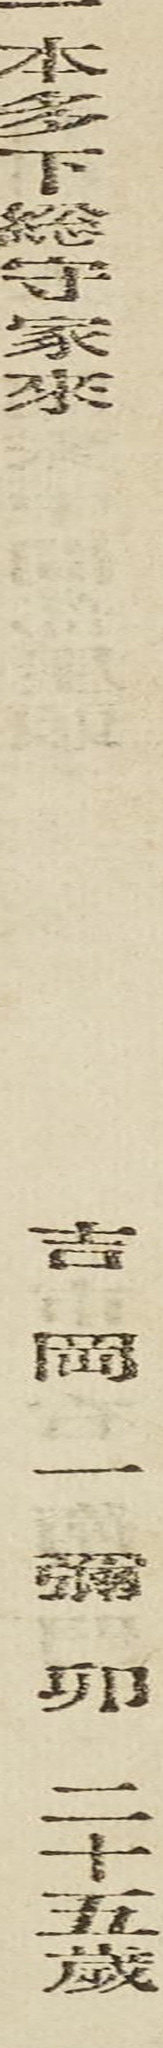一本多下総守家来吉岡一彌卯二十五歳
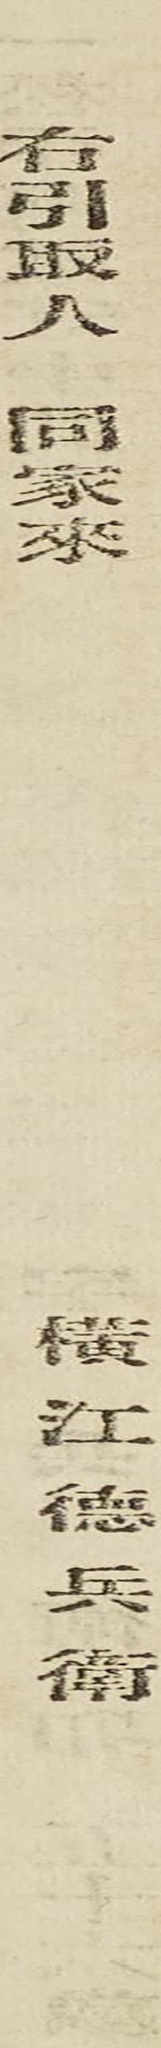右引取人同家来横江徳兵衛
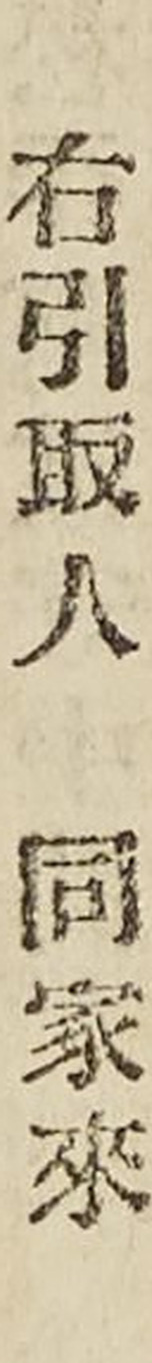右引取人同同
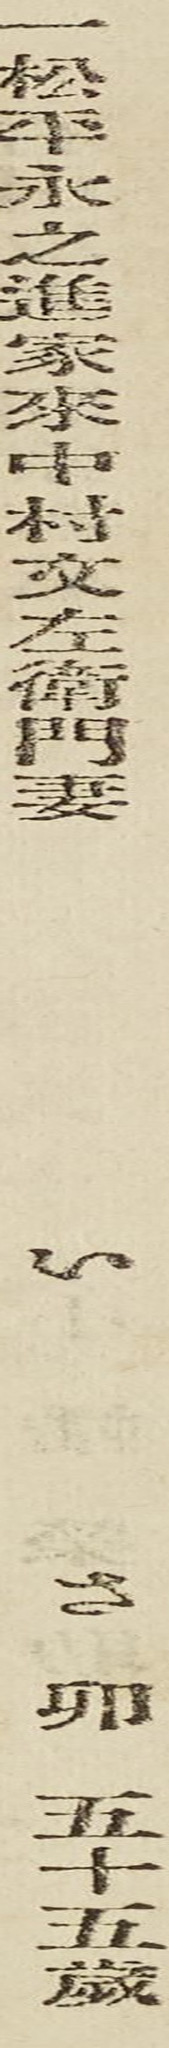一松平永之進家来中村文左衛門妻いさ卯五十五歳
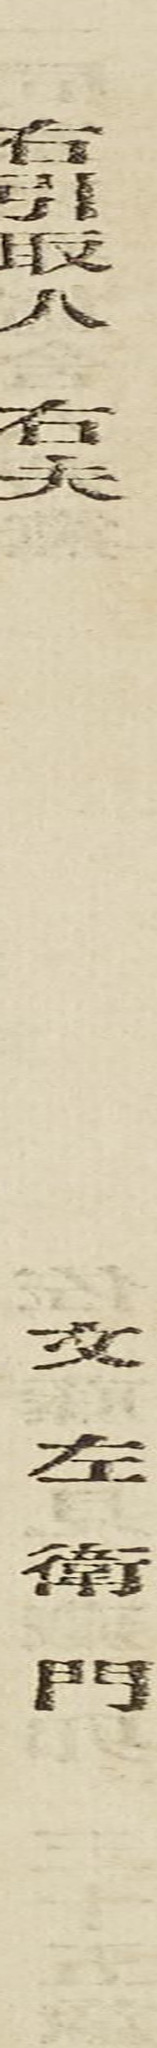右引取人右夫文左衛門
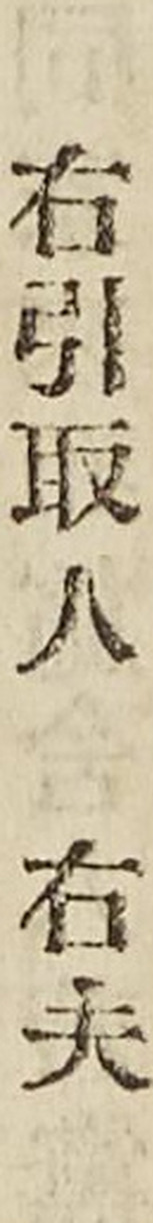右引取人同同
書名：永代惨話　文化の夢　全
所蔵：東京大学地震研究所図書室 Earthquake Research Institute Library, The University of Tokyo, JAPAN
